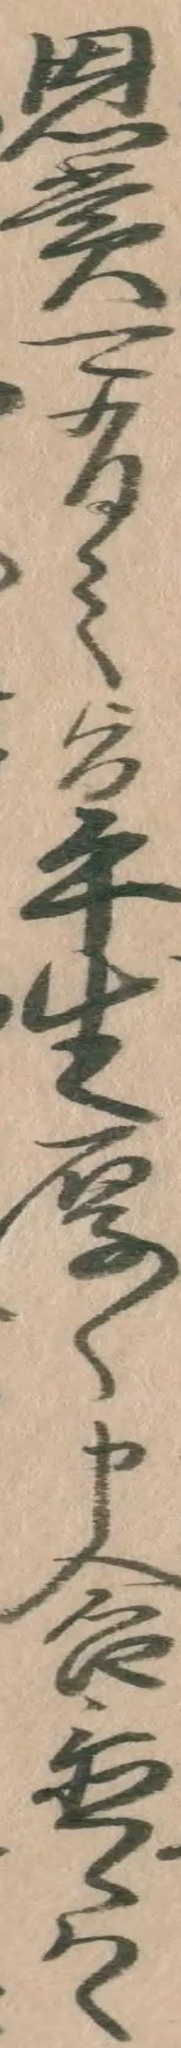恩賞可有之旨平生厚く申含置候ハヽ
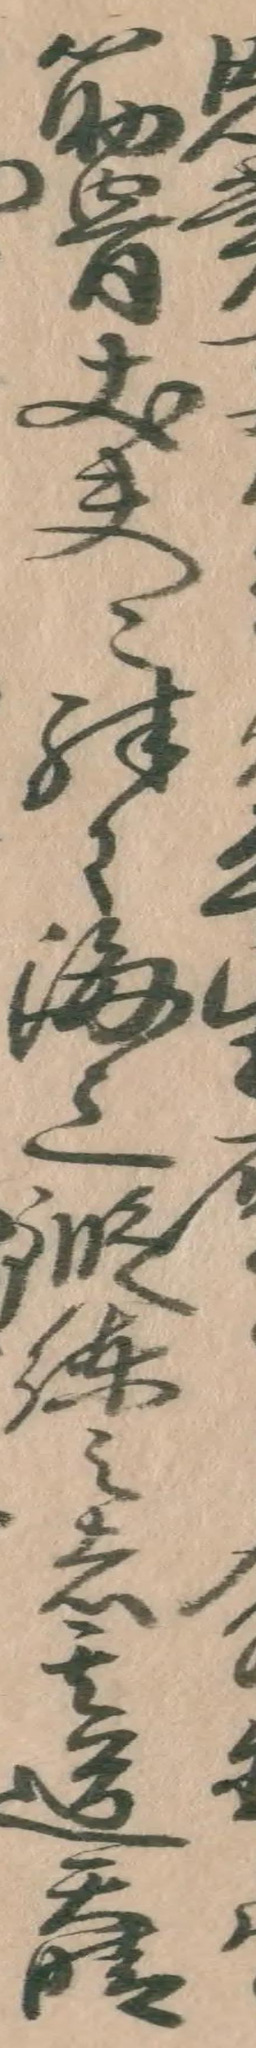筋骨丈夫ニ殊に海上鍛錬之者其道天晴
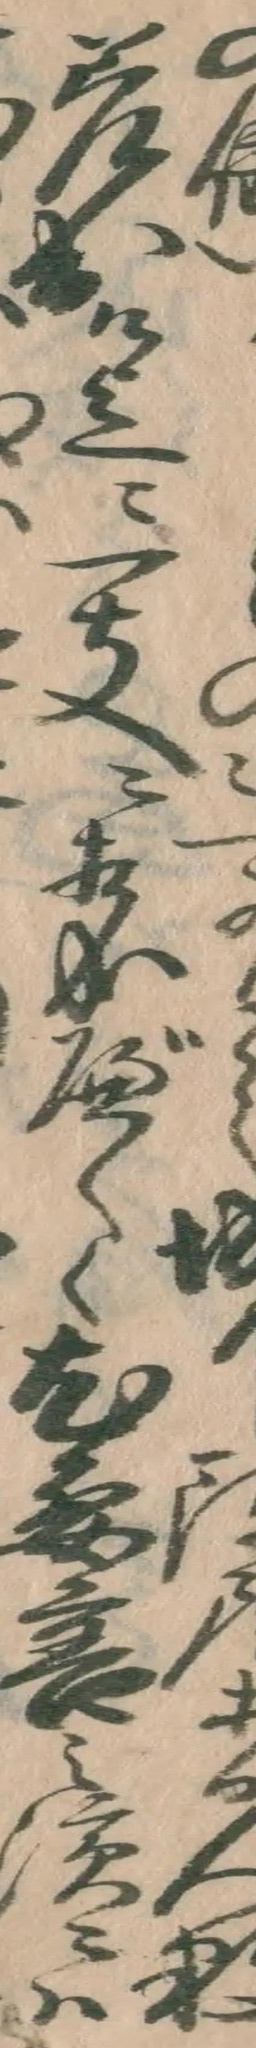差出候迄ニ一支ニ相成べく候尤要害之濱ニハ
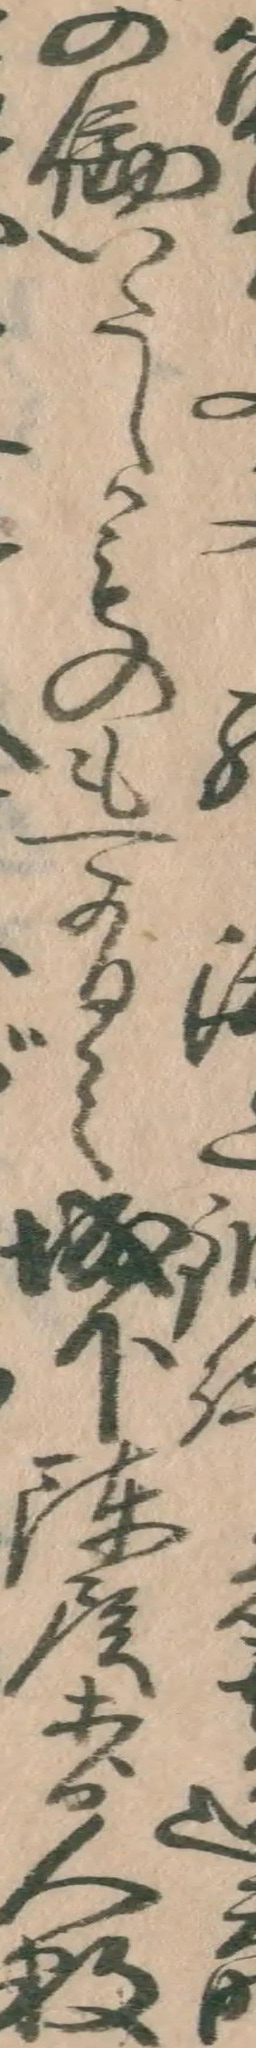の働いたし候ものも可有之城下陣屋等ゟ人数
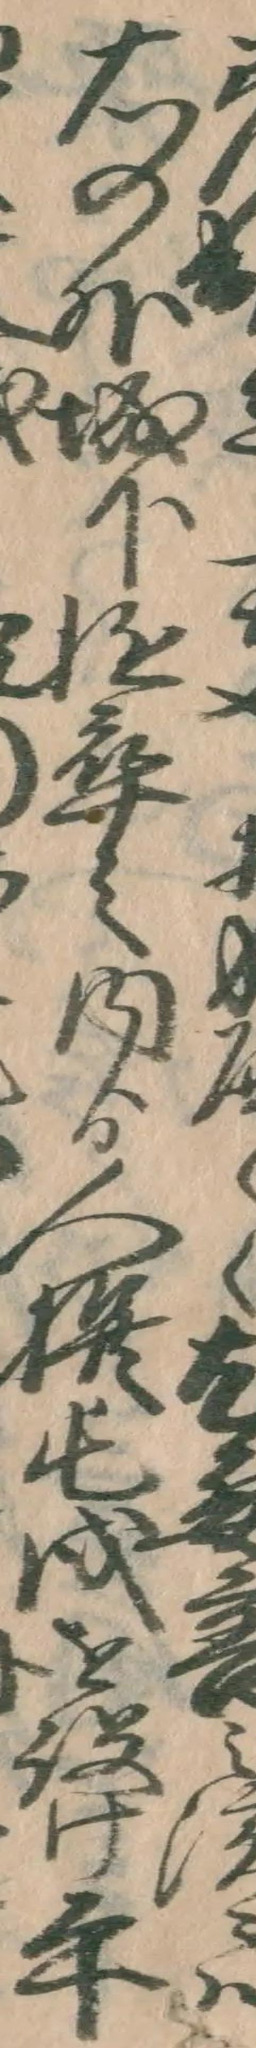右の外城下遊卒之内ゟ人撰屯戌を設け平
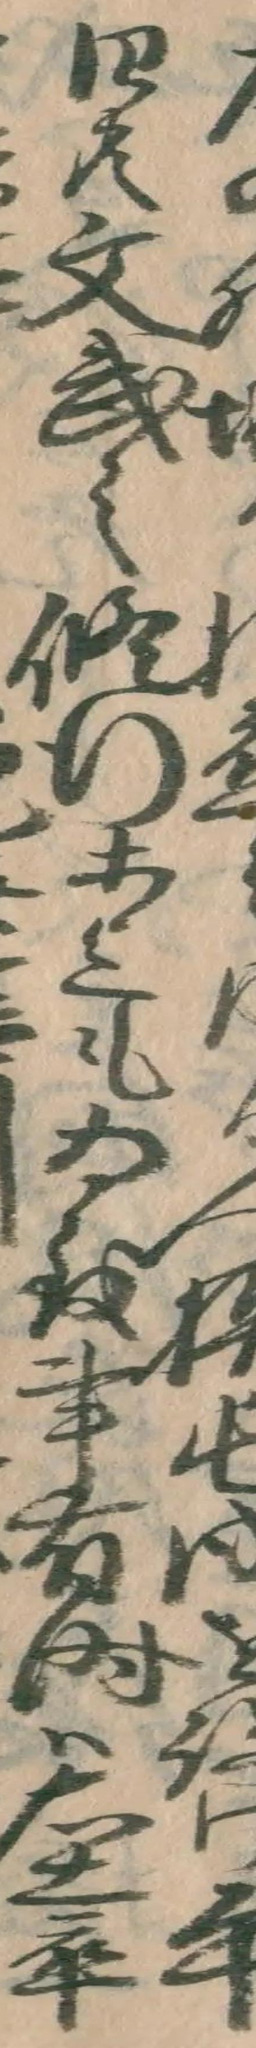日共文武之修行等迄も為致事有時ハ右士卒
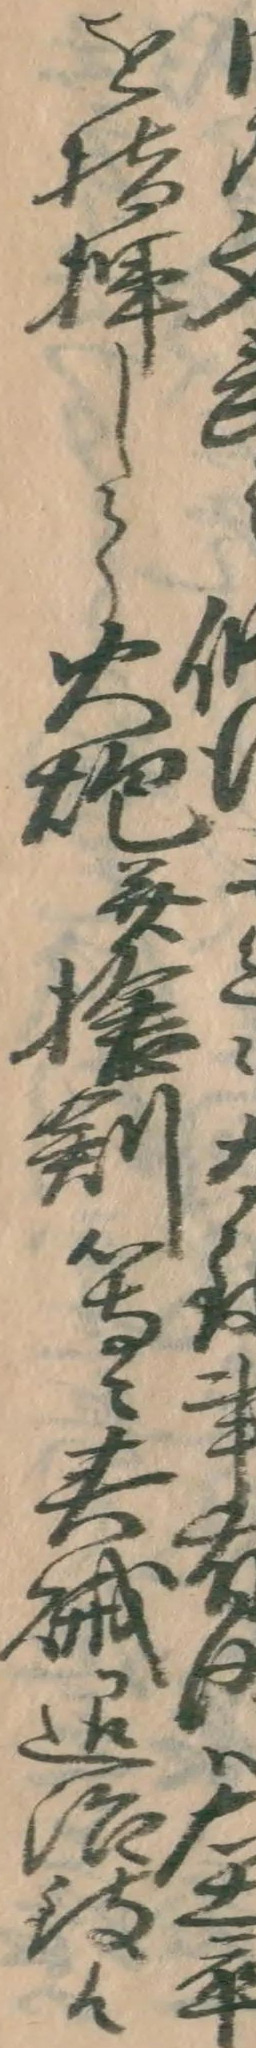を指揮して火炮幷槍剣等ニ夷賊退治致候

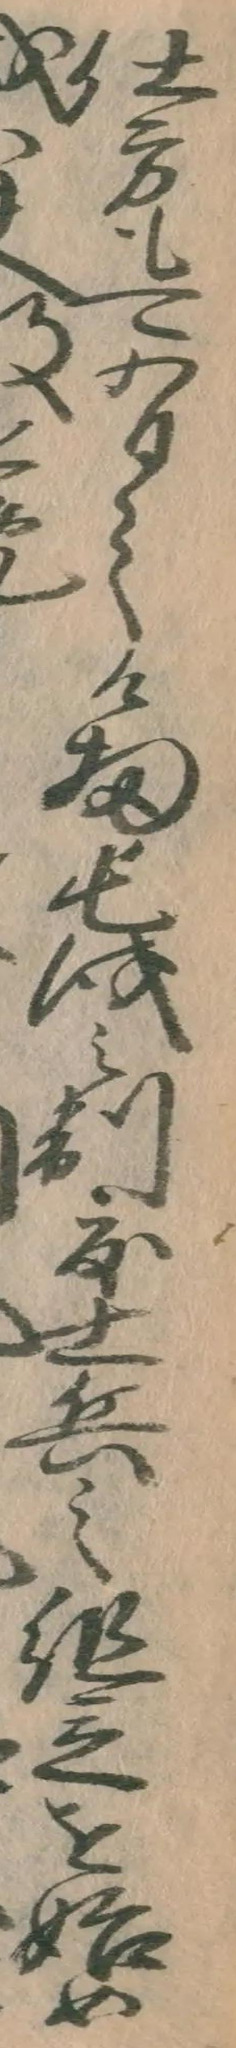仕方も可有之候扨屯戌之制度士兵之組立を始め
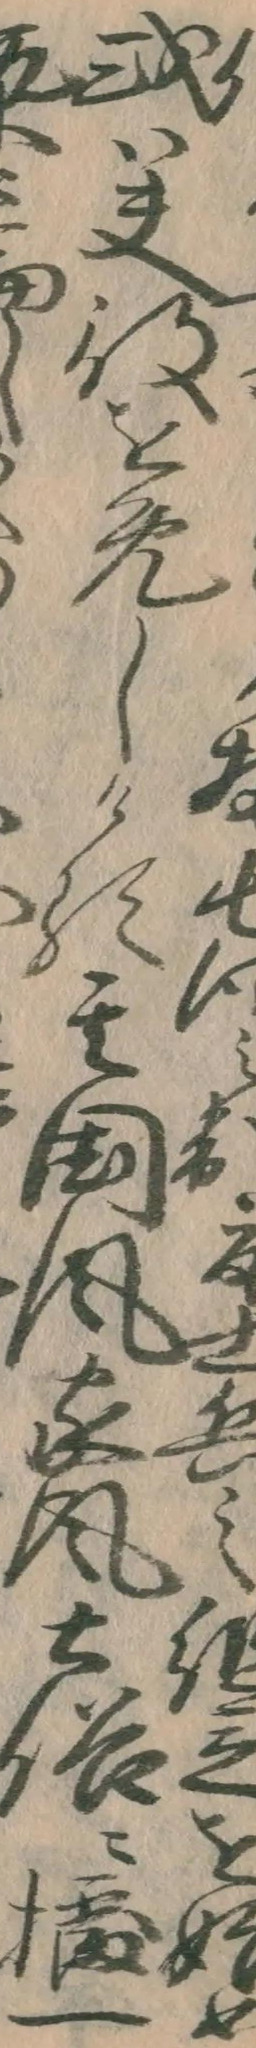或ハ夫役を免しける其国風家風土俗ニ據一
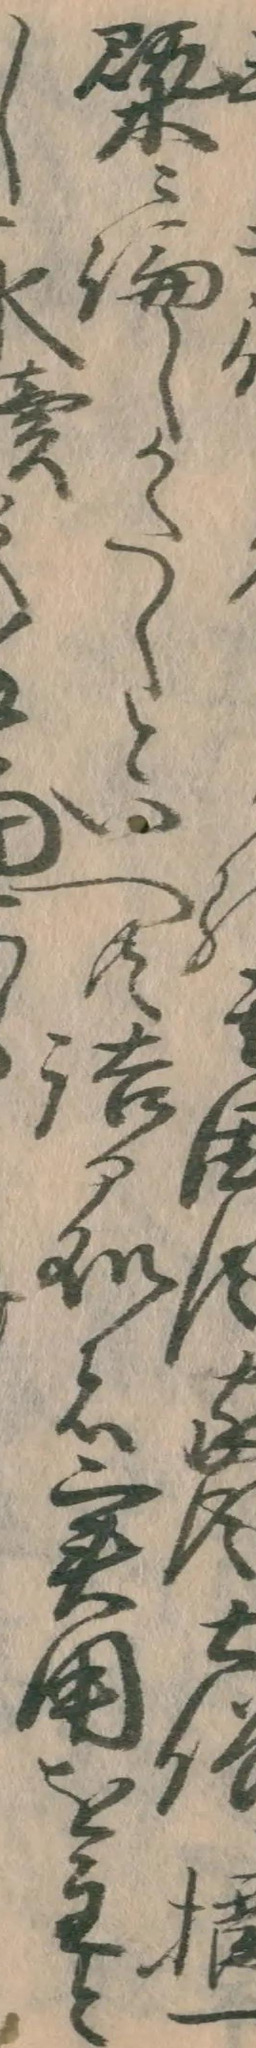概ニ論しかたしといへ共詰る処者実用を主と
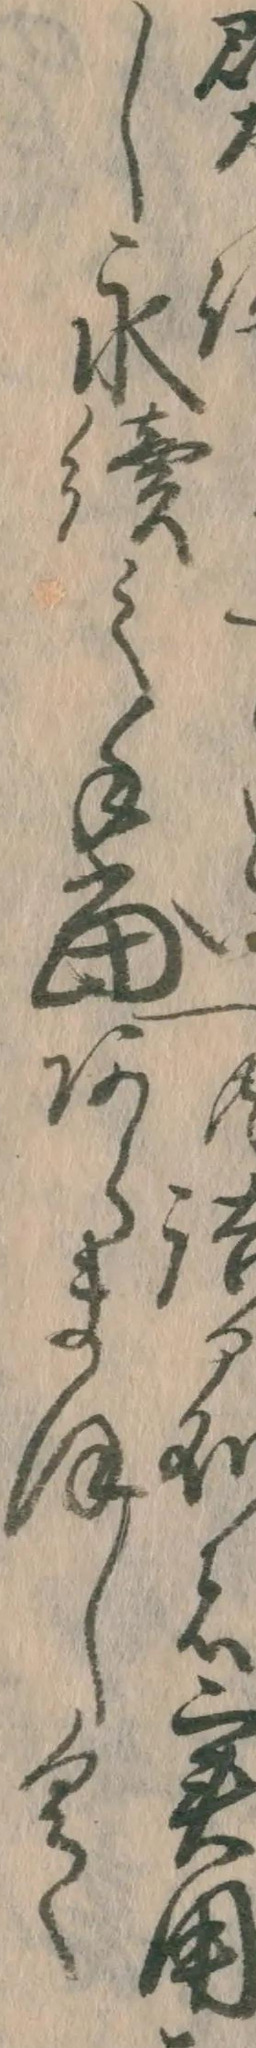し永續之手當あらまほしく候
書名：麗斎叢書. 20
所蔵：国立国会図書館 National Diet Library, JAPAN
